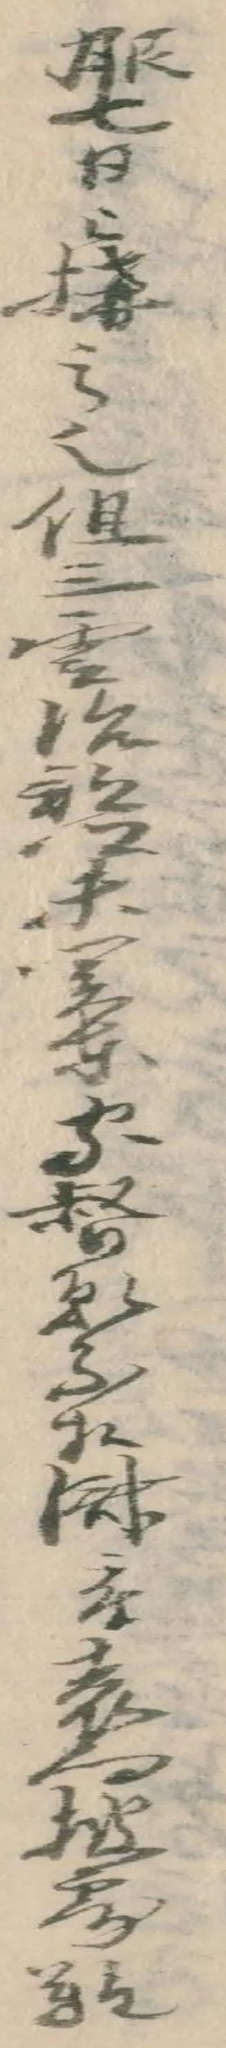服七日被構之也但三雲治部卿未関東家督頼不相済ニ付表向披露難
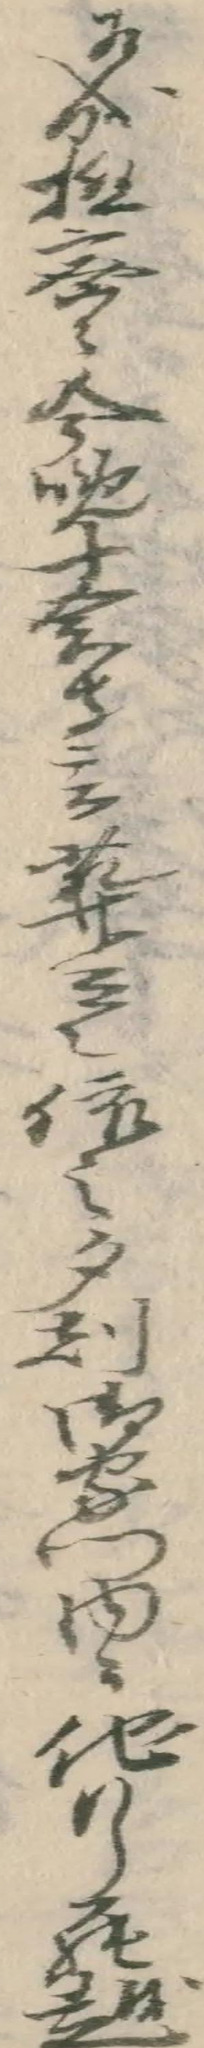相成極密々今晩十念寺ニ而葬云々依之夕刻御家門内々他行罷越
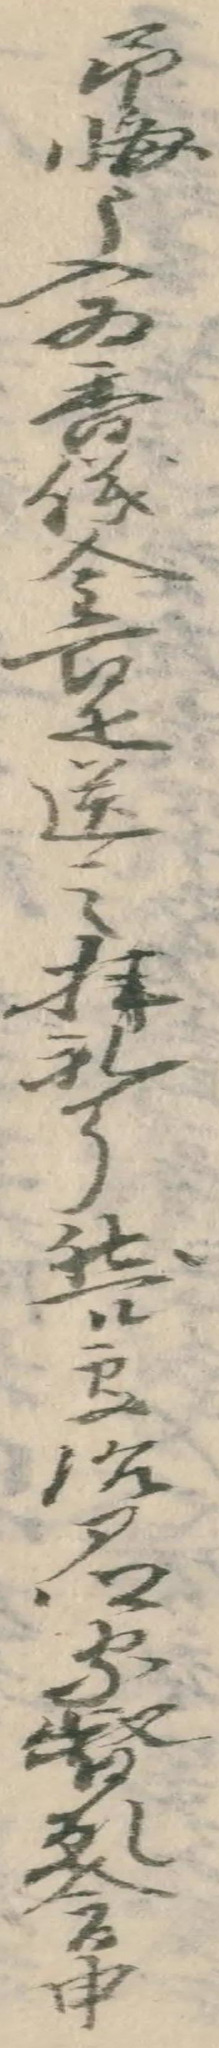弔悔申入為香儀金百疋送之拝礼了然ル處治部卿家督願含申
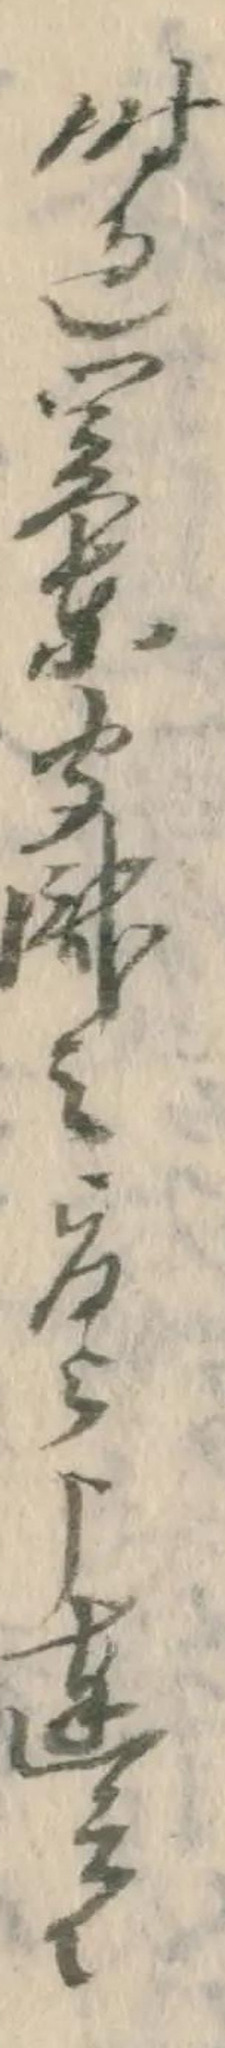時過関東聞済之旨被申達云々
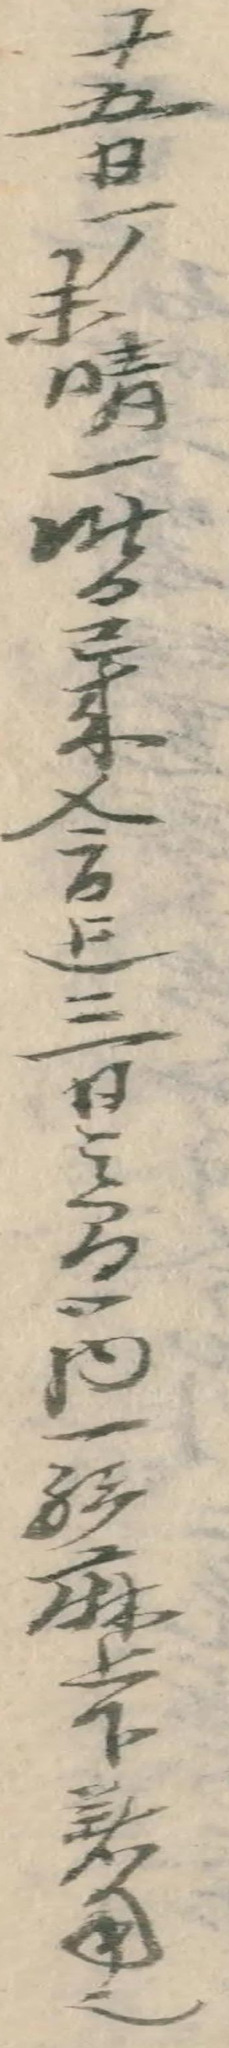十五日丁未晴一昨日已来今日迄三日之間御内一統麻上下着用也
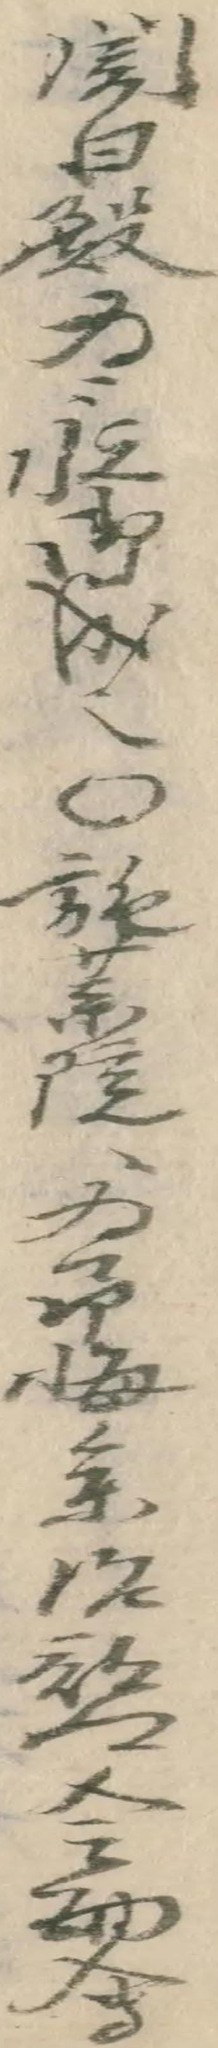関白殿為御祝御成也○施薬院へ為弔悔参治部卿令面會
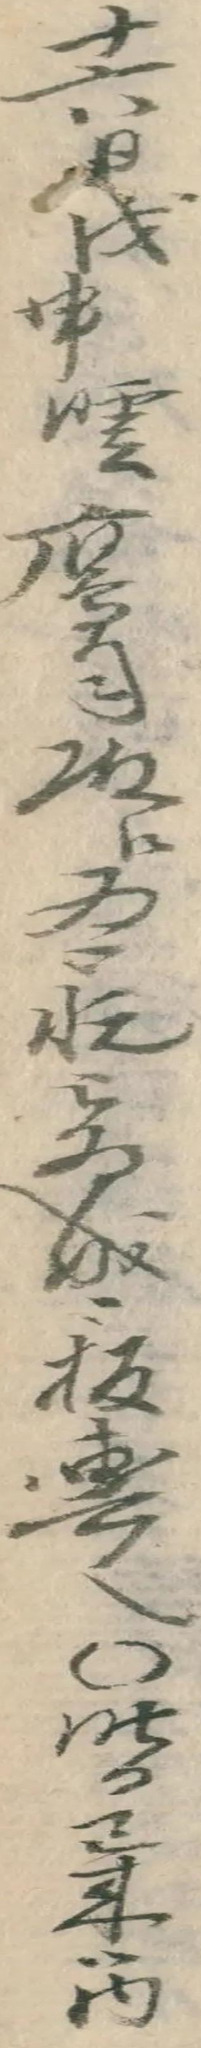十六日戊申曇鷹司殿え為祝被為成御板鎌輦也〇昨日已来御内

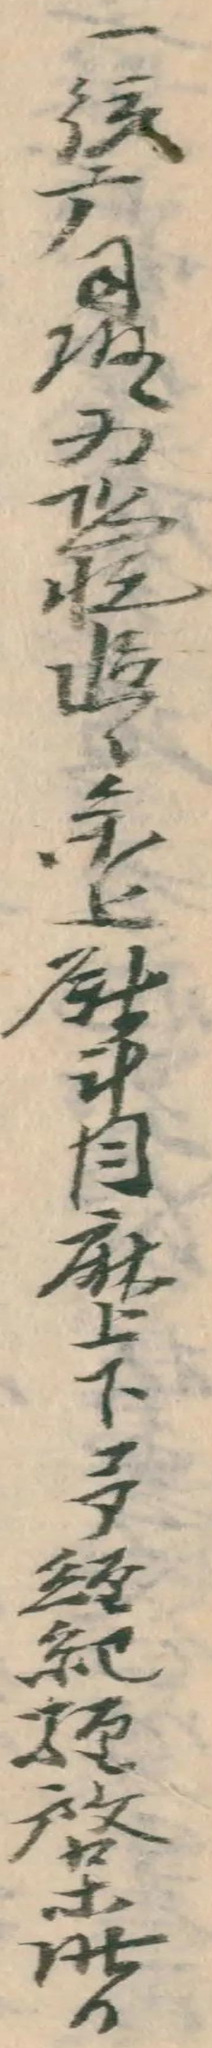一統鷹司殿ヘ為恐悦追々参上熨斗目麻上下予経紀経啓等昨日
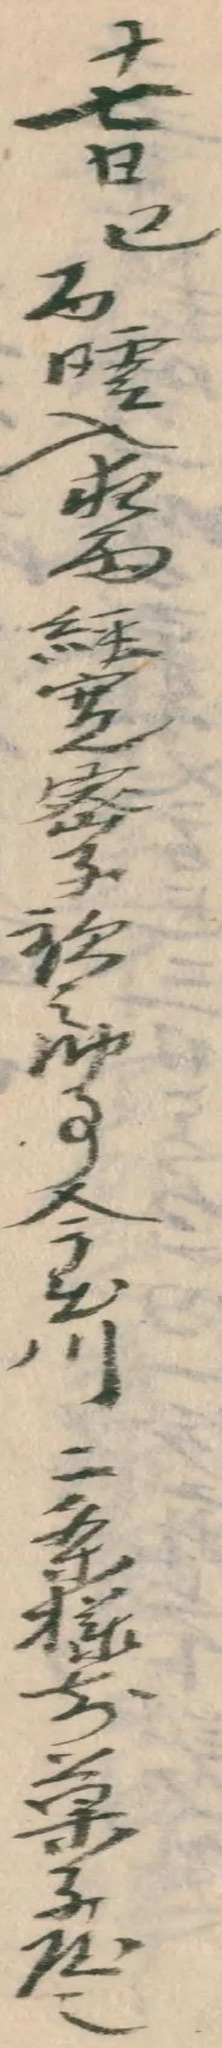十七日己酉曇入夜雨経寛密子欽之助事今出川ニ条様前菓子屋之
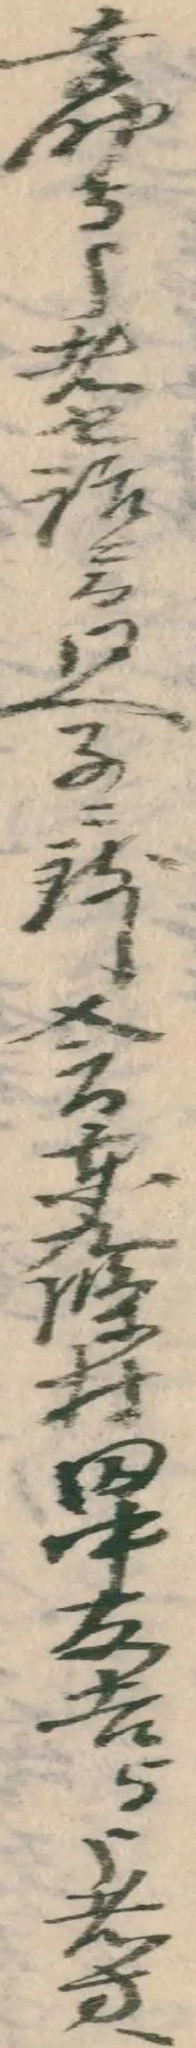幸助と申者世話ニ而同人子ニ致し又方東九條村田中友吉と申者方へ
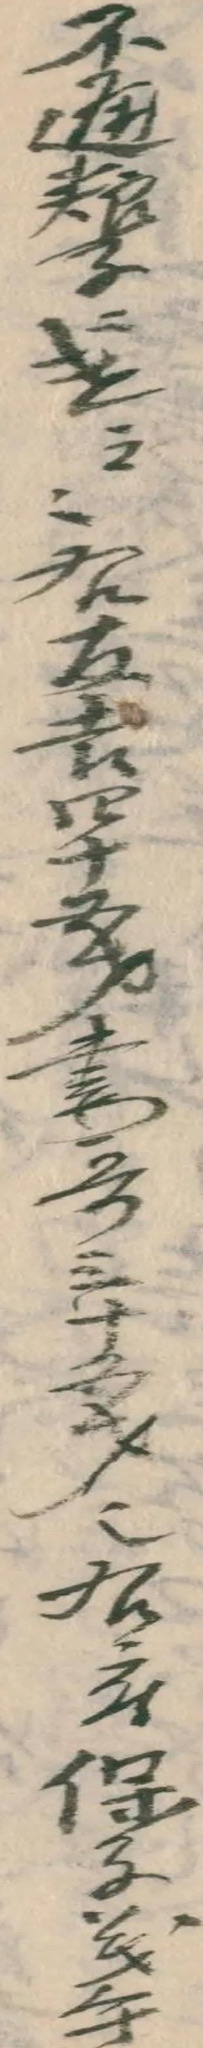不通養子ニ遣云〻右友吉四十五才妻哥三十五才也右ニ付保子義午
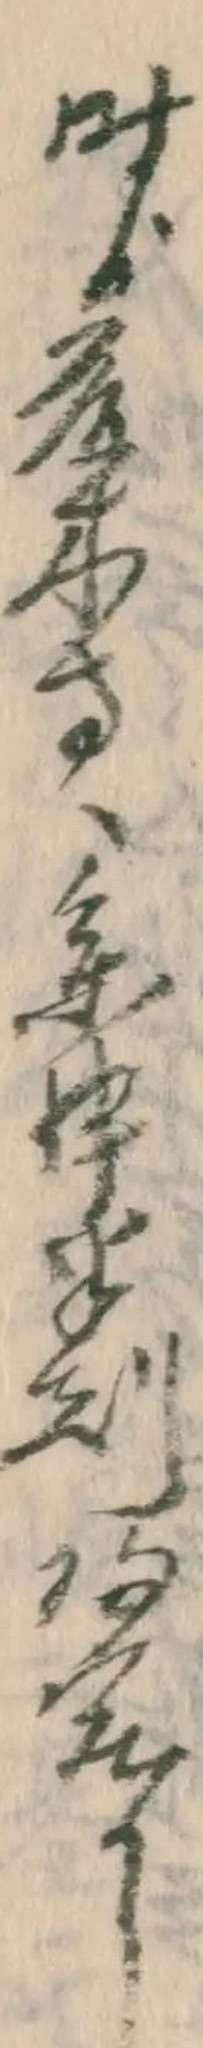時ゟ藤木方へ参申半刻帰宅了
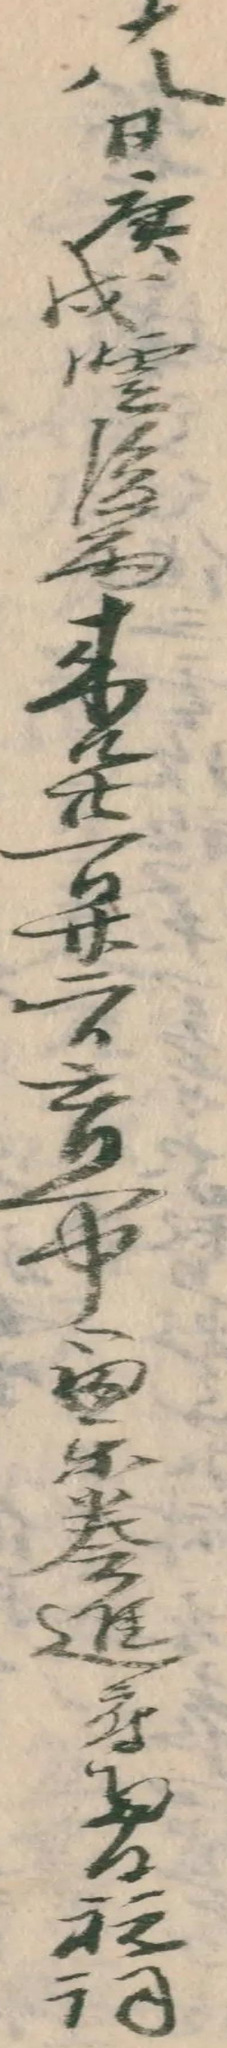十八日庚戌曇後雨来ル廿一日廿二日育人中御田楽奏進ニ付當日祝詞
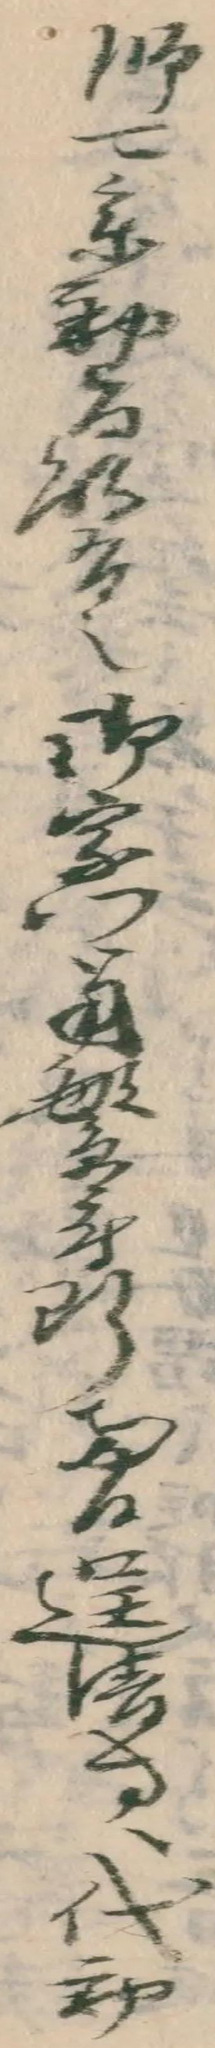師可参勤旨觸有之御家門御用繁に付断両日逞清方へ代勤
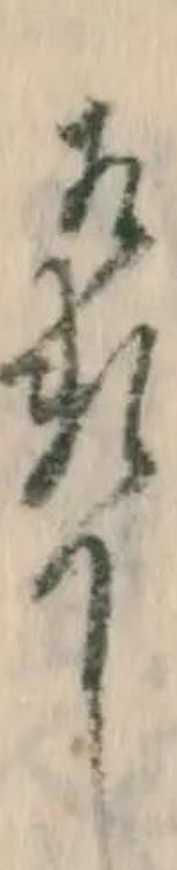相頼了
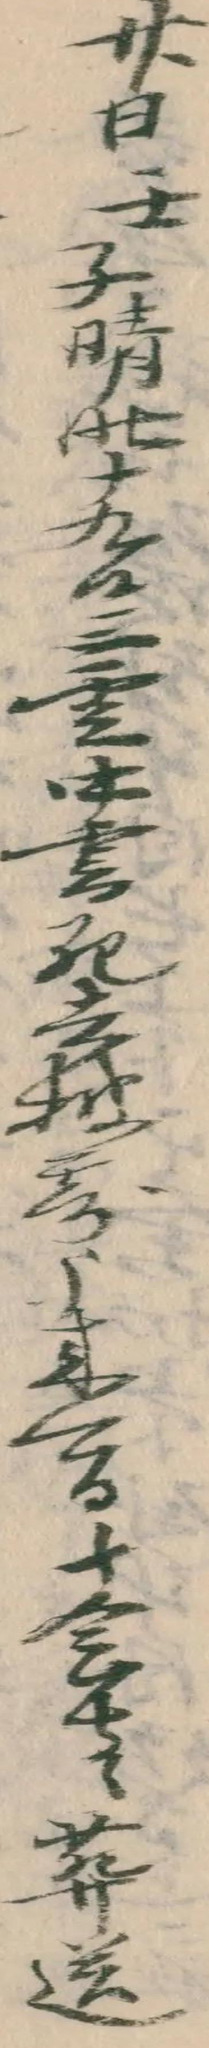廿日壬子晴昨十九日三雲中書死去披露申来今日十念寺へ葬送
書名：賀茂社記録. 第69冊
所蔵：国立国会図書館 National Diet Library, JAPAN
